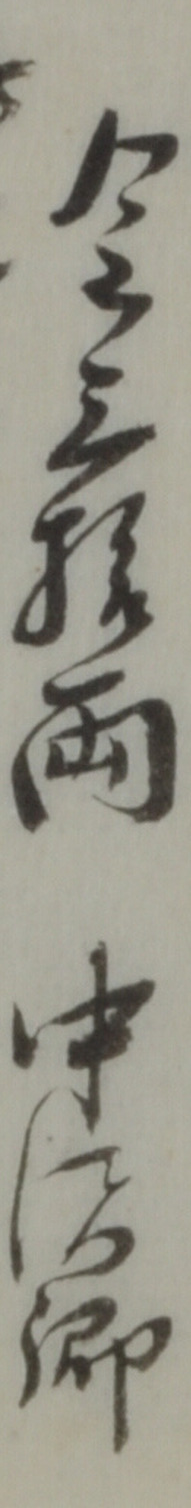金三拾両中沢郷
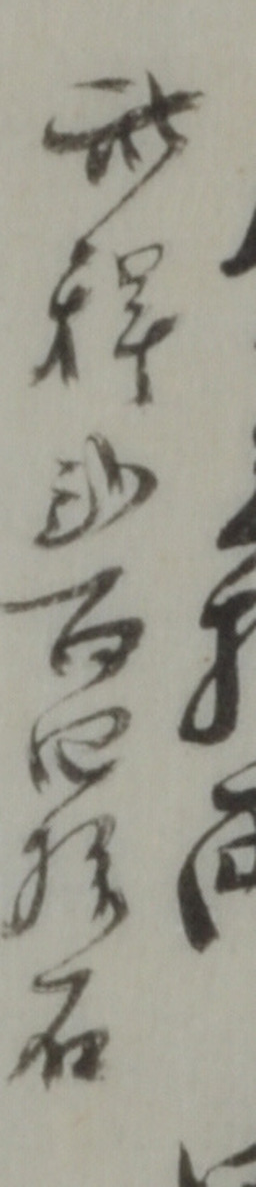此稈弐百四拾石
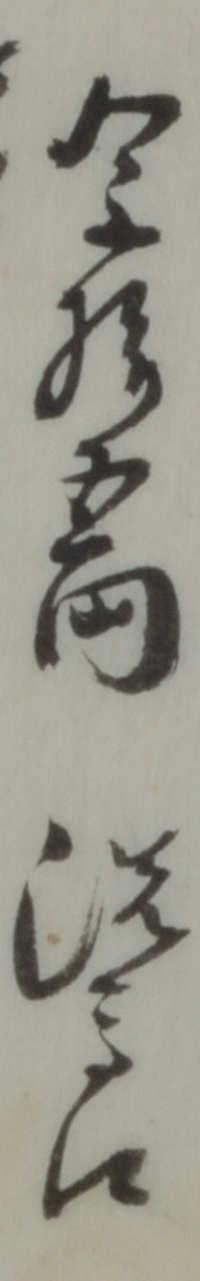金拾五両洗馬郷
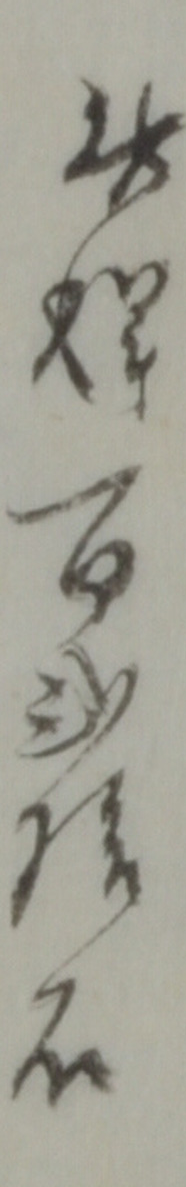此稈百弐拾石
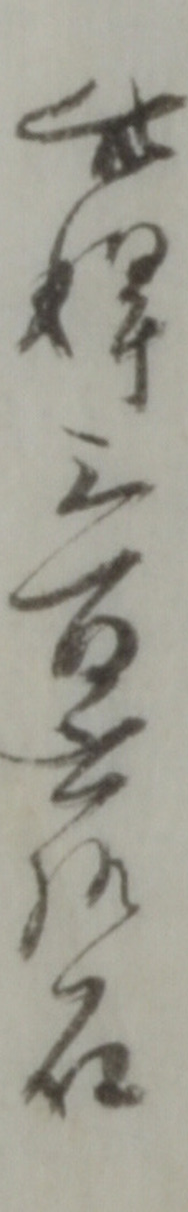此稈三百六拾石

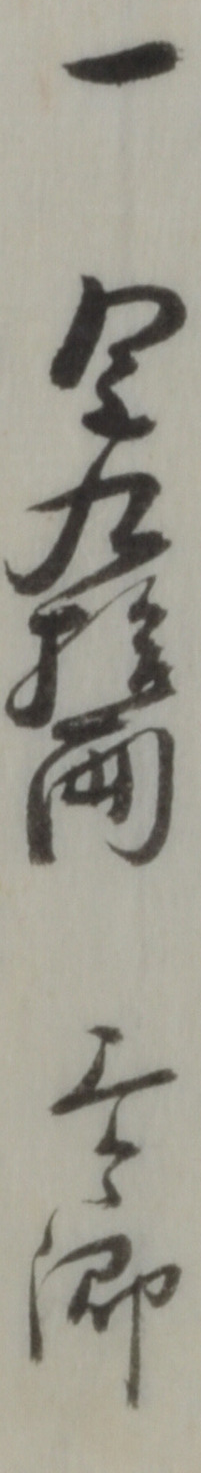一金九拾両三ヶ郷
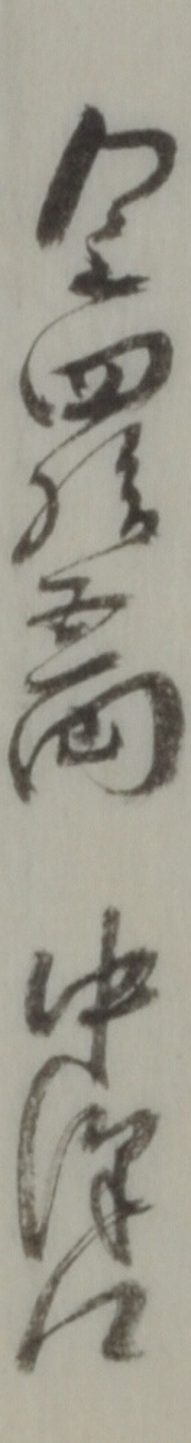金四拾五両中沢郷
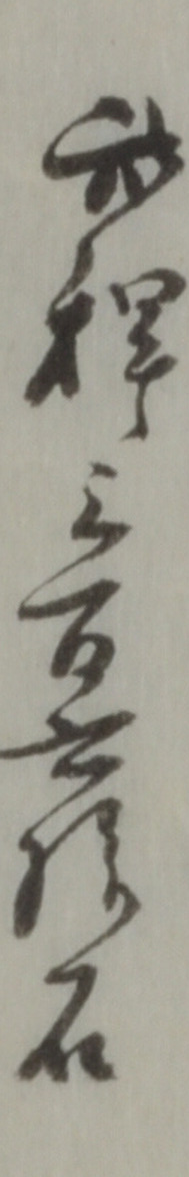此稈三百六拾石
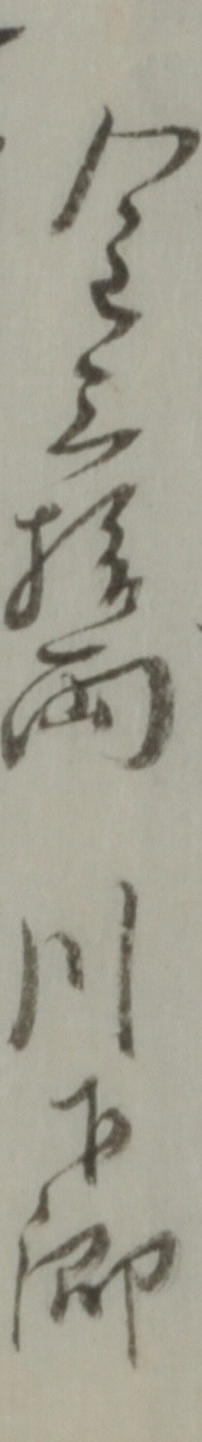金三拾両川下郷
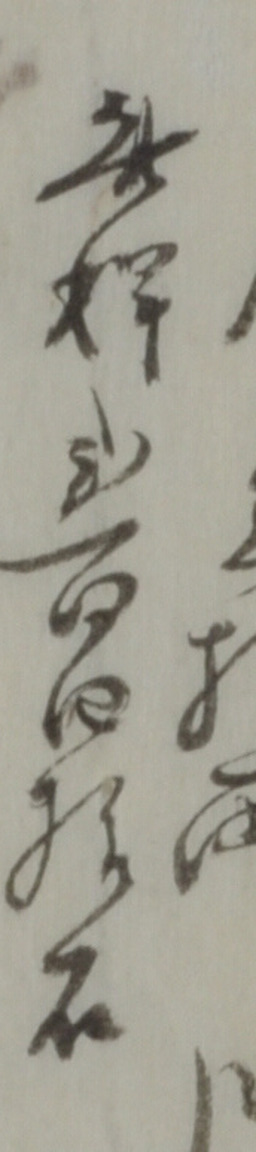此稈弐百四拾石
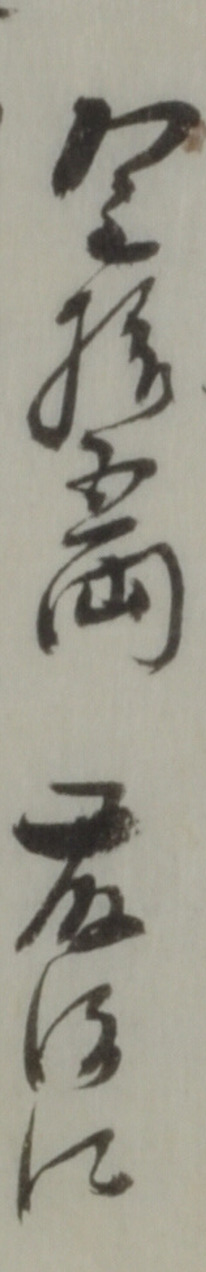金拾五両藤沢郷
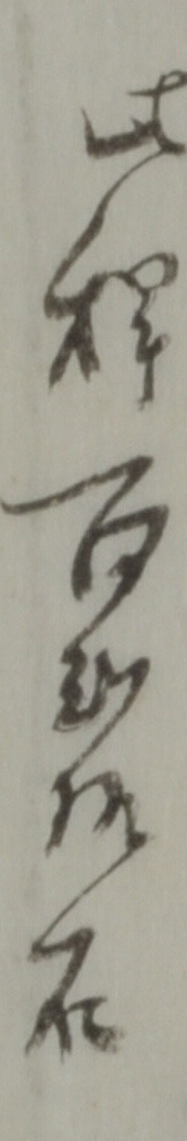此稈百弐拾石
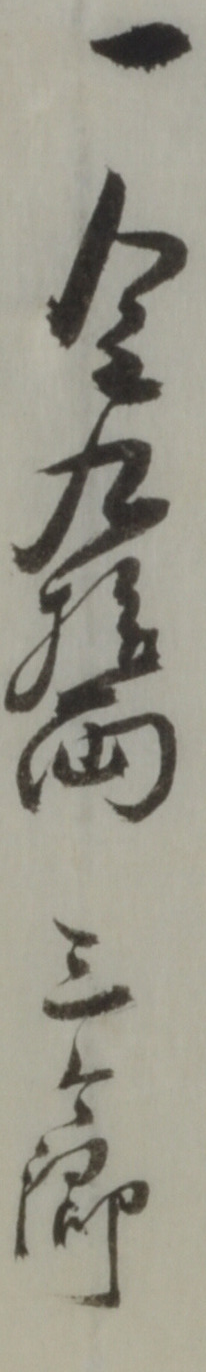一金九拾両三ヶ郷
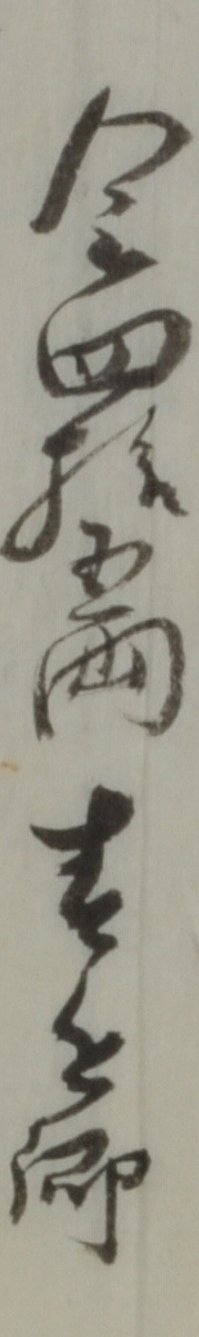金四拾五両春近郷
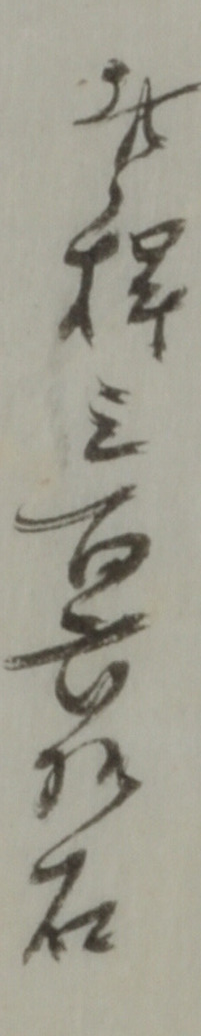此稈三百六拾石
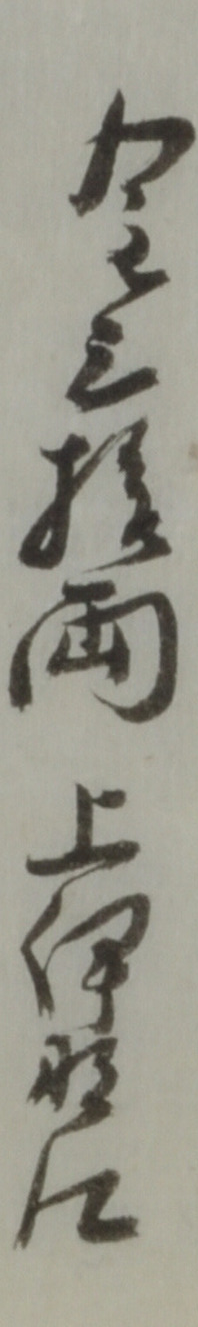金三拾両上伊那郷
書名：在町雑穀御買入大図
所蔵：伊那市立高遠町図書館・合同会社AMANE
